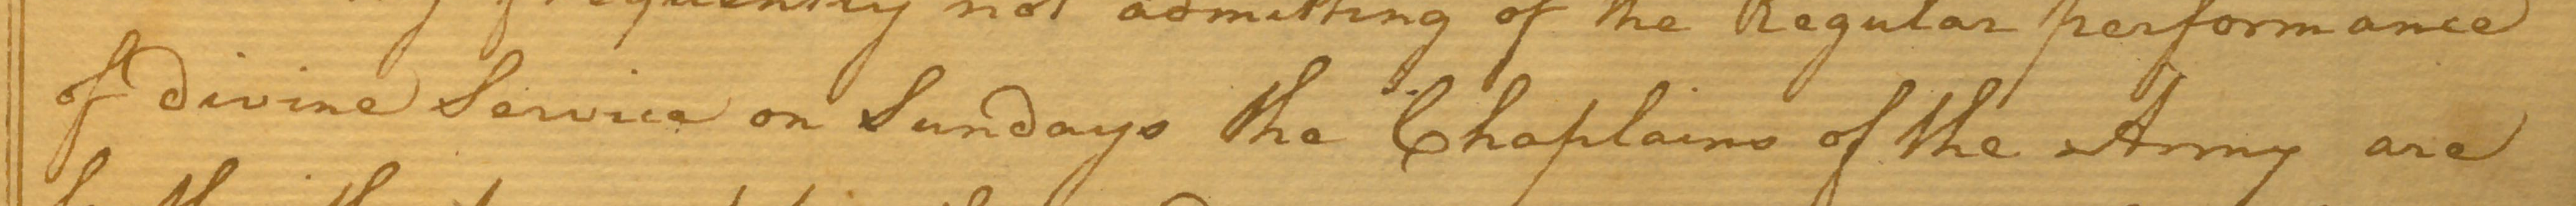of divine Service on Sundays the Chaplains of the Army are
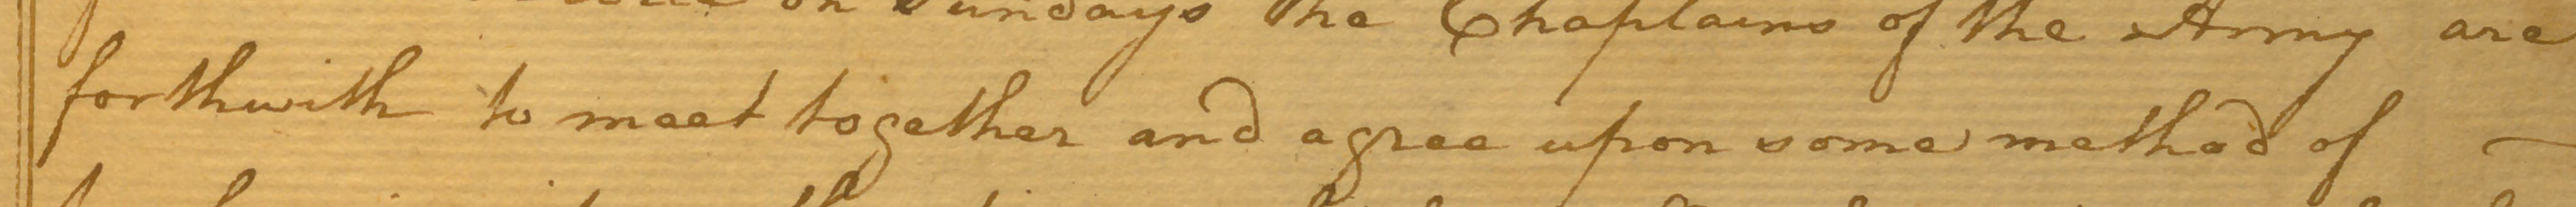forthwith to meet together and agree upon some method of
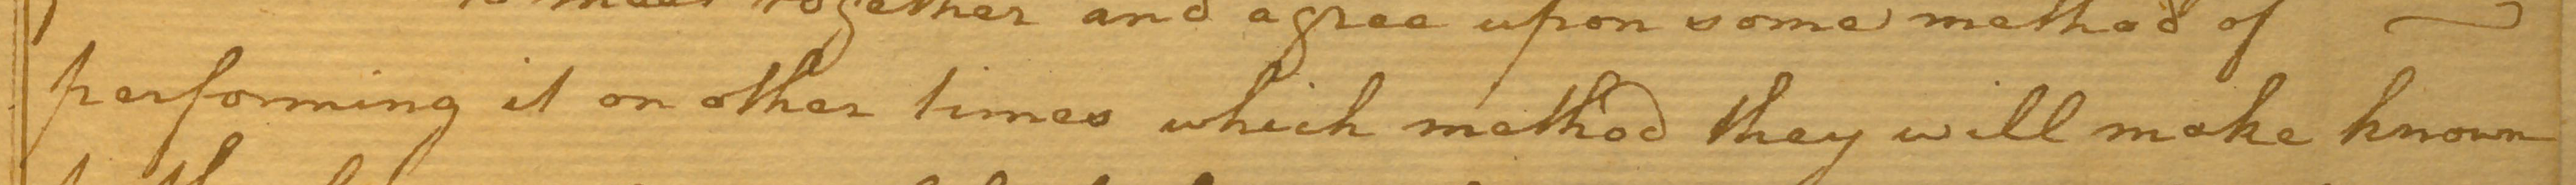performing it on other times which method they will make known
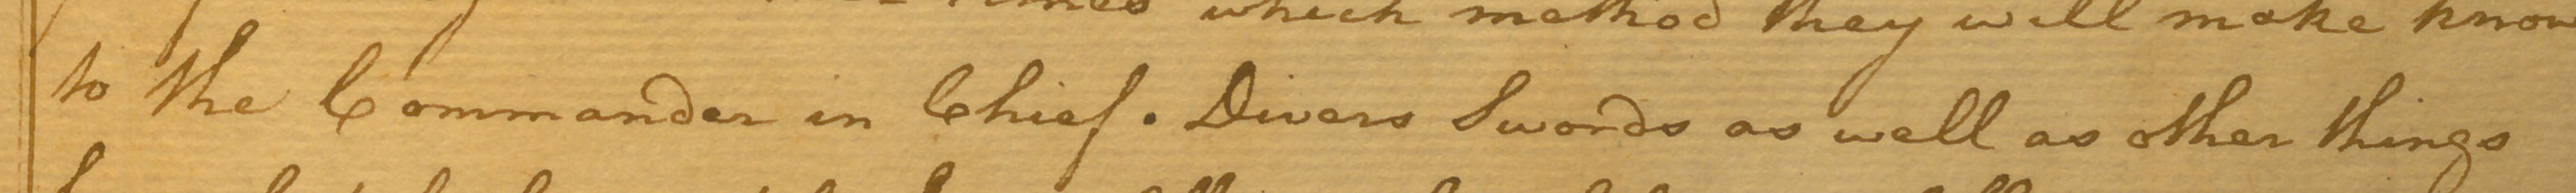to the Commander in Chief. Divers Swords as well as other thing
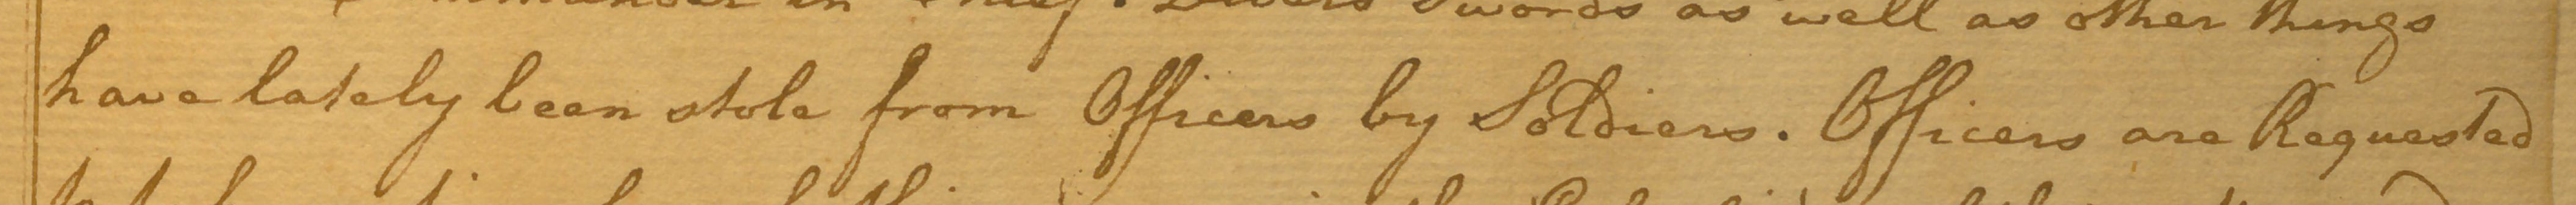have lately been stole from Officers by Soldiers. Officers are Requested
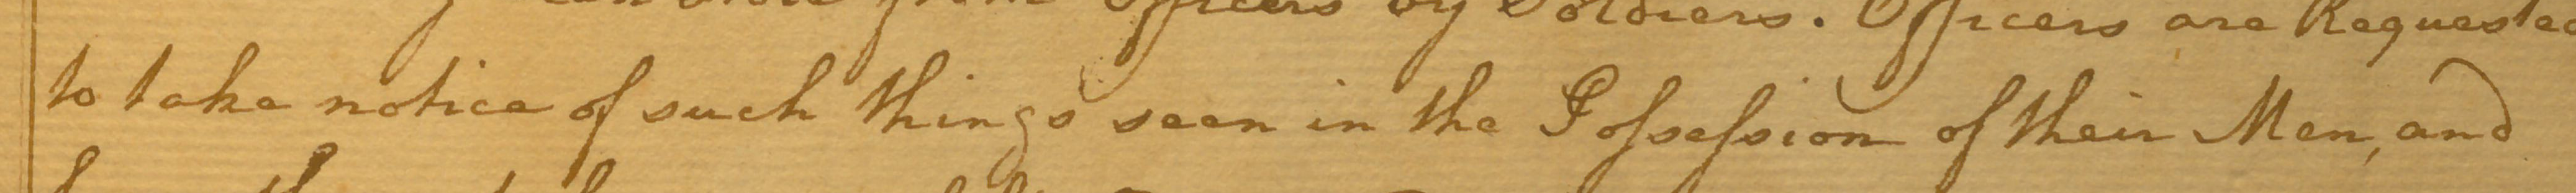to take notice of such things seen in the Possession of their Men, and
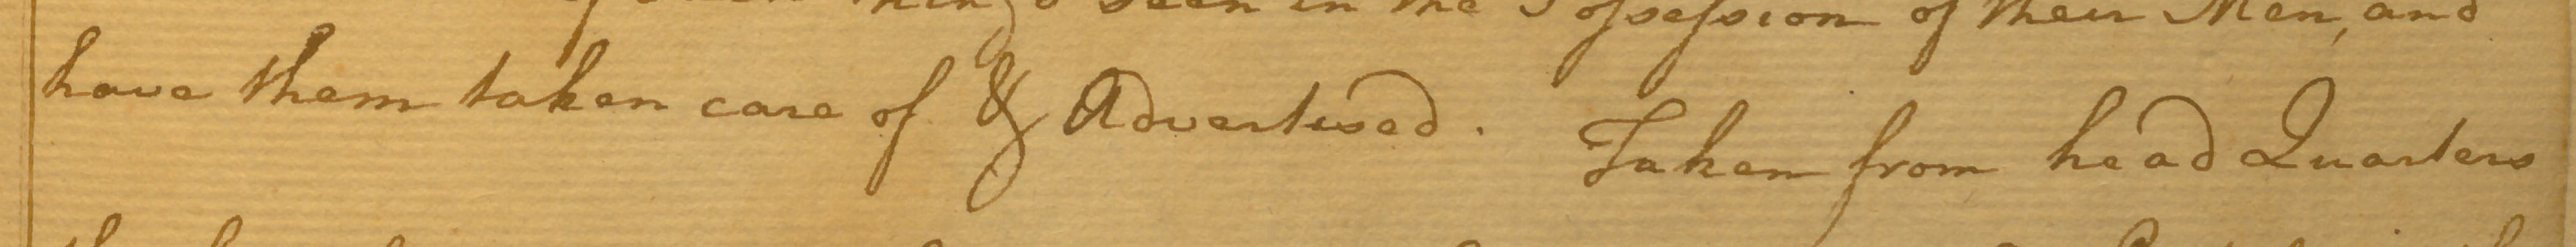have them taken care of & Advertised. Taken from head Quarters
